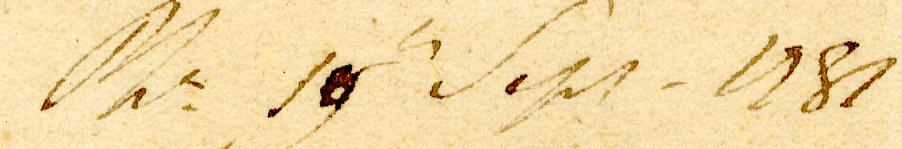Ph^a. 19^th Sept. 1781
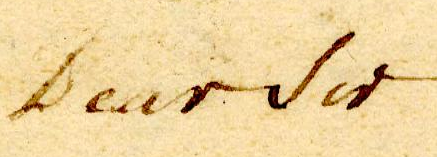Dear Sir
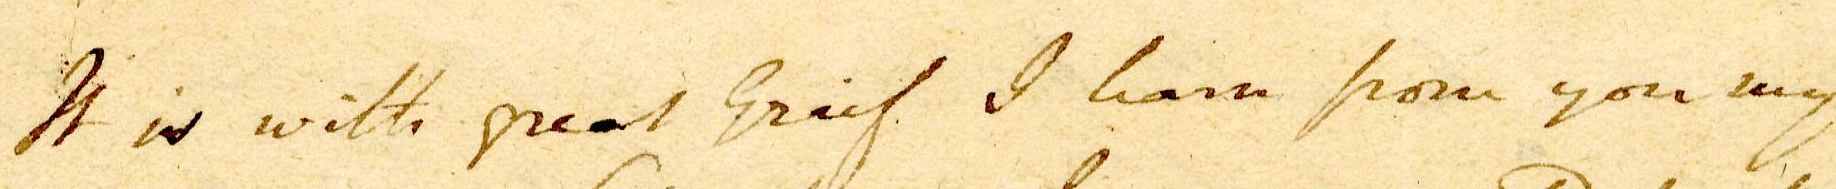It is with great Grief I hear from you my
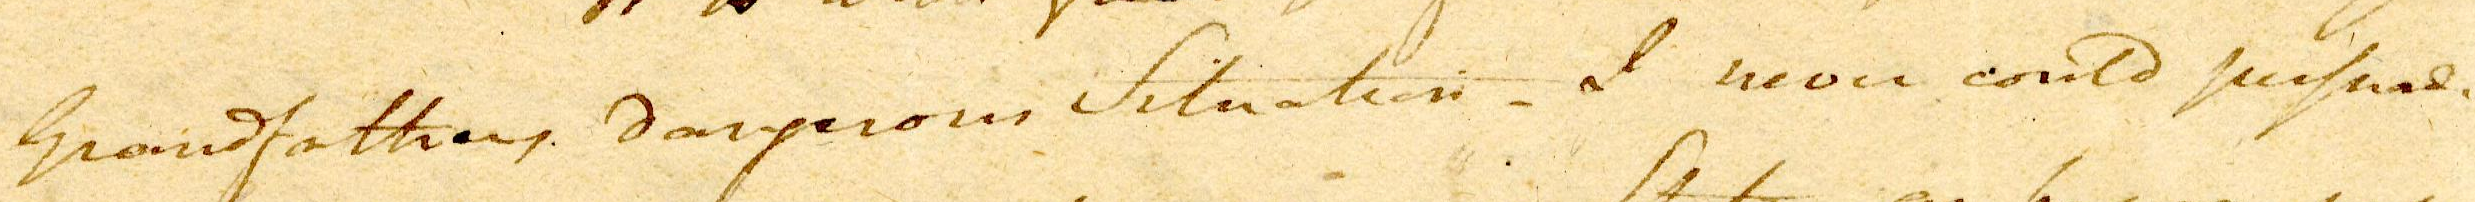Grandfathers dangerous Situation. I never could persuade
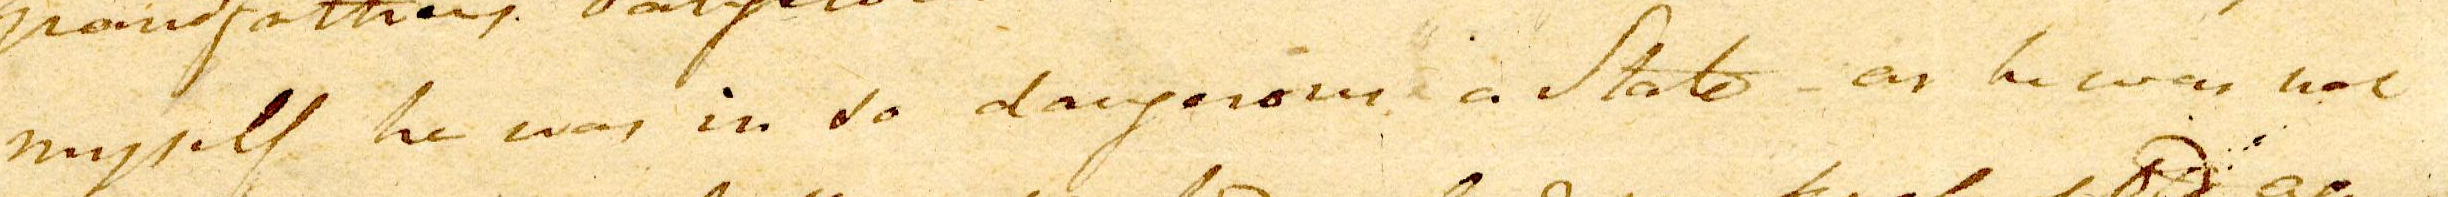myself he was in so dangerous a State- as he was not
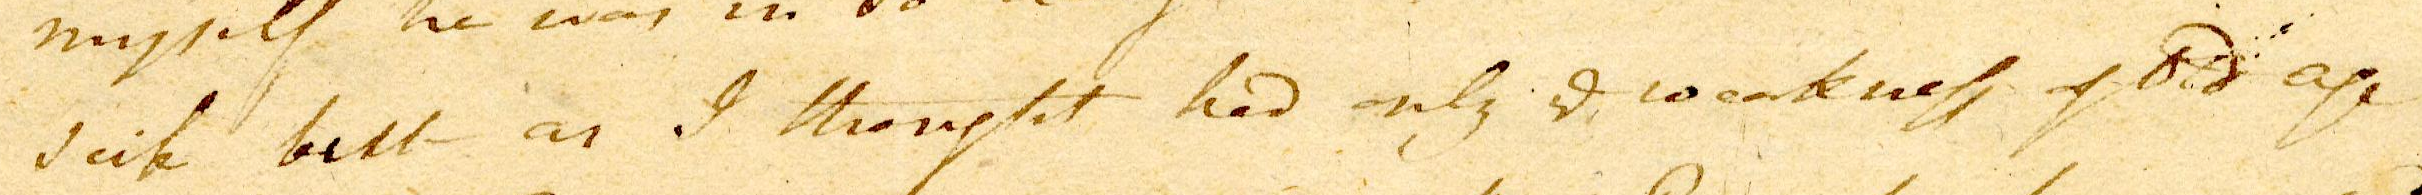sick but as I thought had only y^e weakness of Old Age
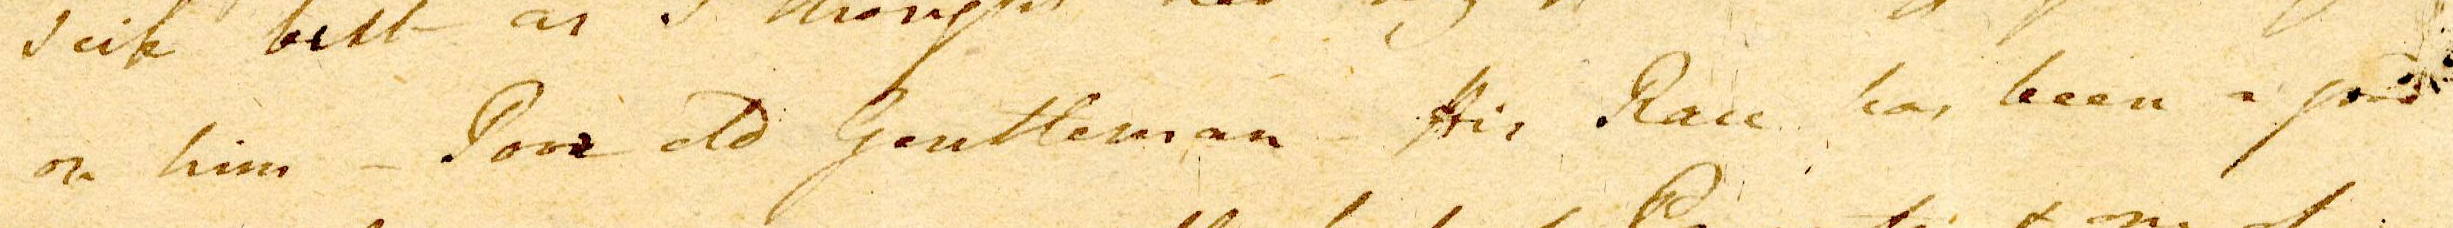on him Poor old Gentleman. His Race bas been a good
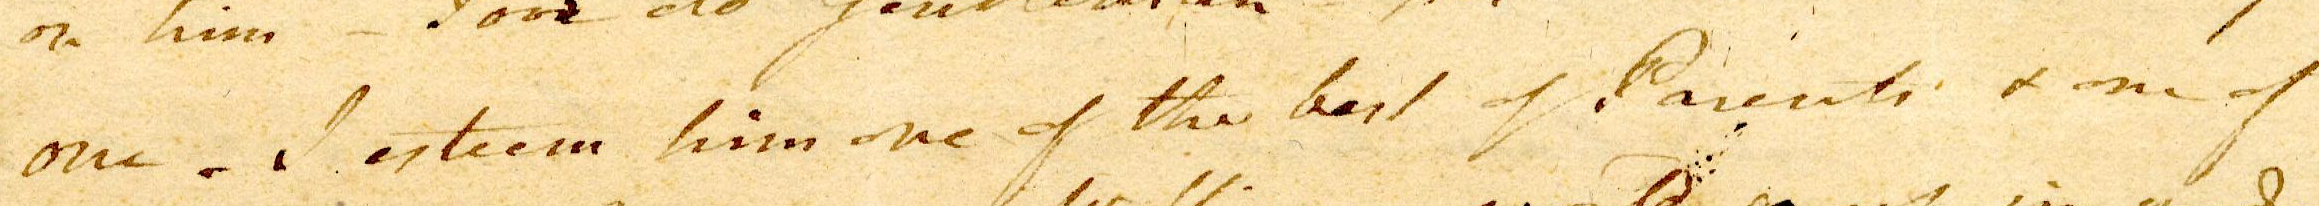one. I esteem him one of the best of Parents & one of
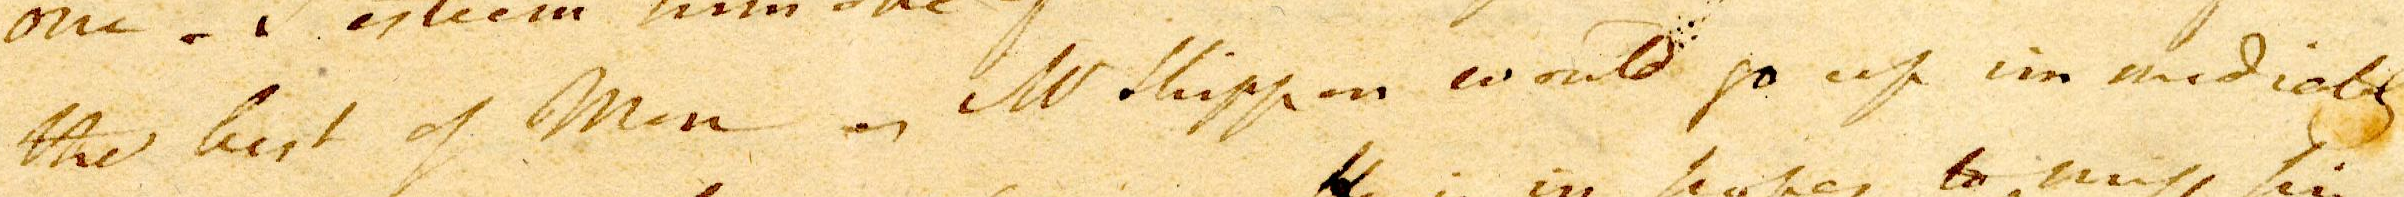the best of Men. M^r Shippen would go up in in midialy
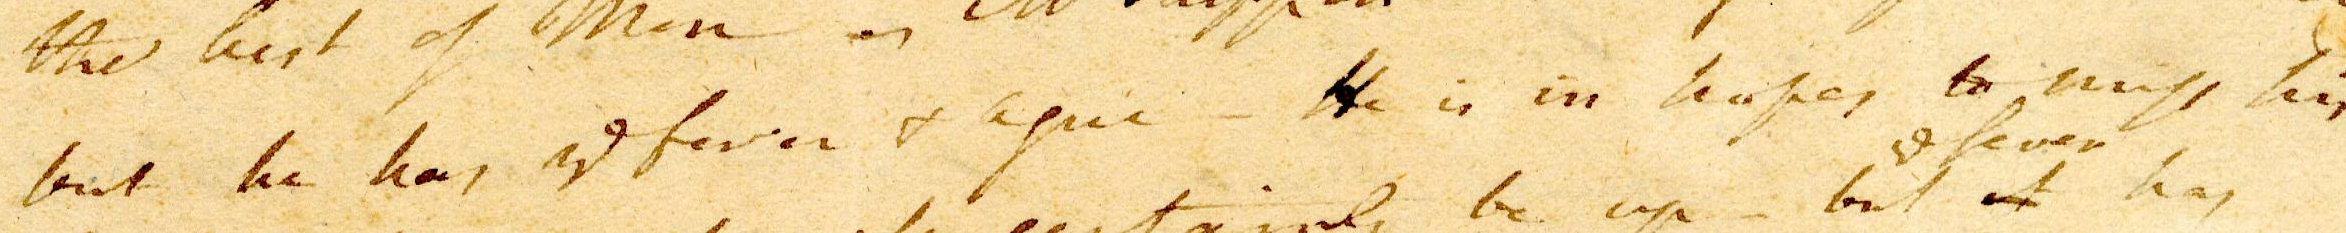but he has y^e fever & ague. He is in hopes to miss his
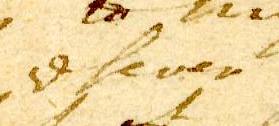y^e fever
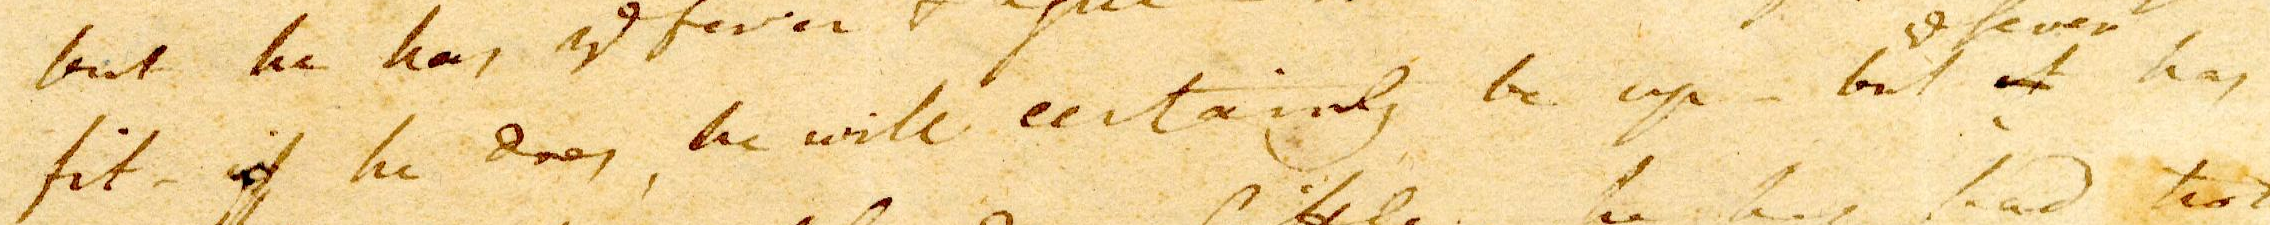fit if he does he will certainly be up but ^ it has
